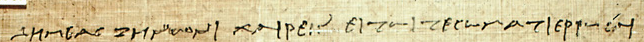δημεαϲ ζηνωνι χαιρειν ειτωιτεϲωματιερρωϲαι
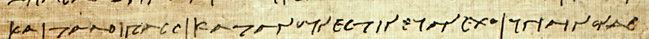καιταλοιπαϲοικατανουνεϲτινευανεχοιυγιαινονδε
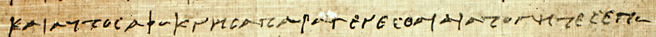καιαυτοϲαφωκνηϲαπαραγενεϲθαιδιατομητεϲεπω
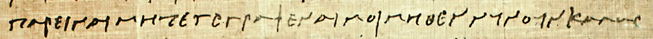παρειναιμητεγεγραφεναιμοιμηθεννυνουνκαλωϲ
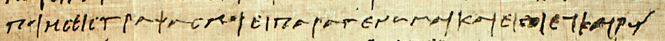ποιηϲειϲγραψαϲμοιειπαραγενωμαικαιειϲοιευκαιρον
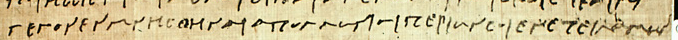γεγονενμνηϲθηναιαπολλωνιωιπεριωνϲοιενετειλαμην
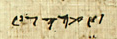ευτυχει
